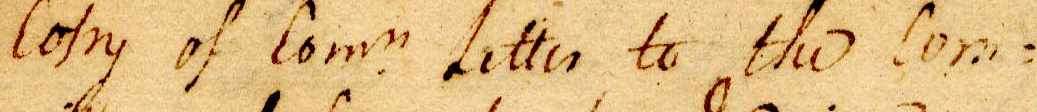Copy of Com^rs. Letter to the Com-
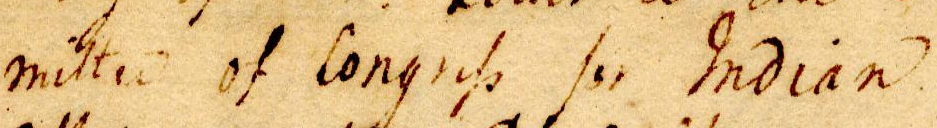mittee of Congress for Indian
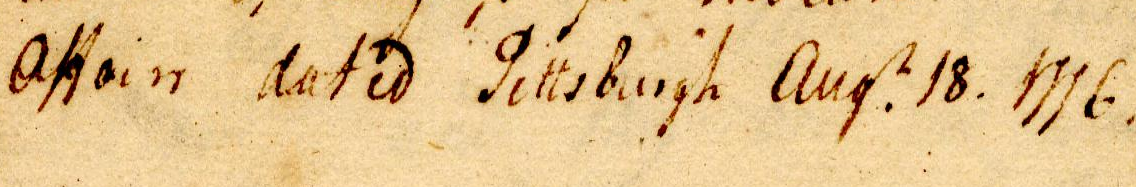Affairs dated Pittsburgh Aug^t. 18. 1776.
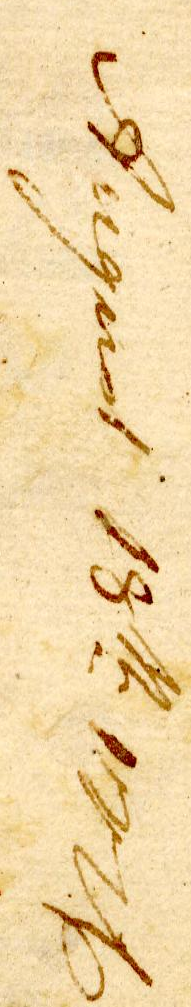August 18^th 1776
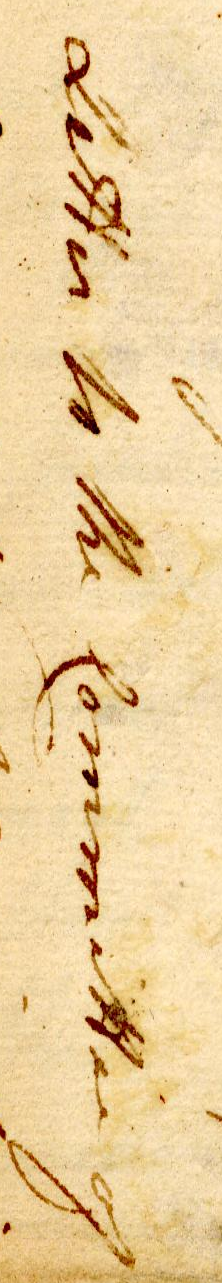Letter to the Committee of
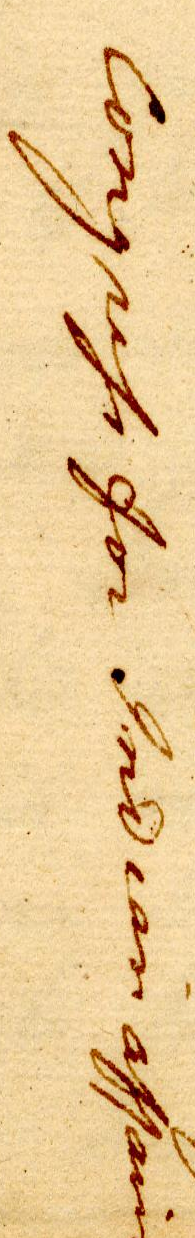Congress for Indian affairs
